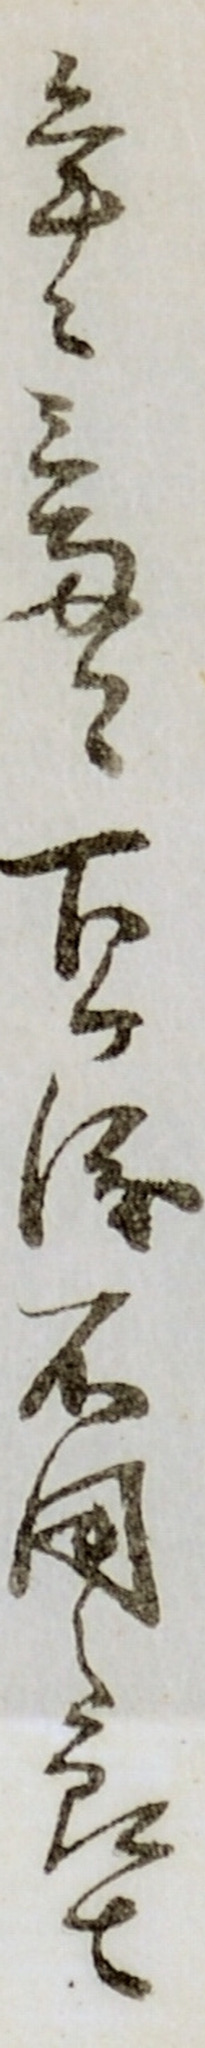年に三両ツヽ下ヶ渡不用之節は
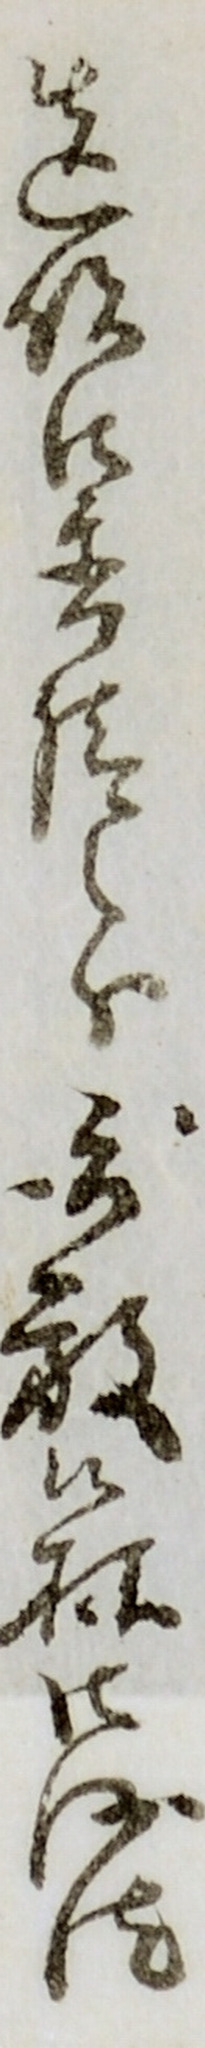造作御普請之分取放候様御沙汰
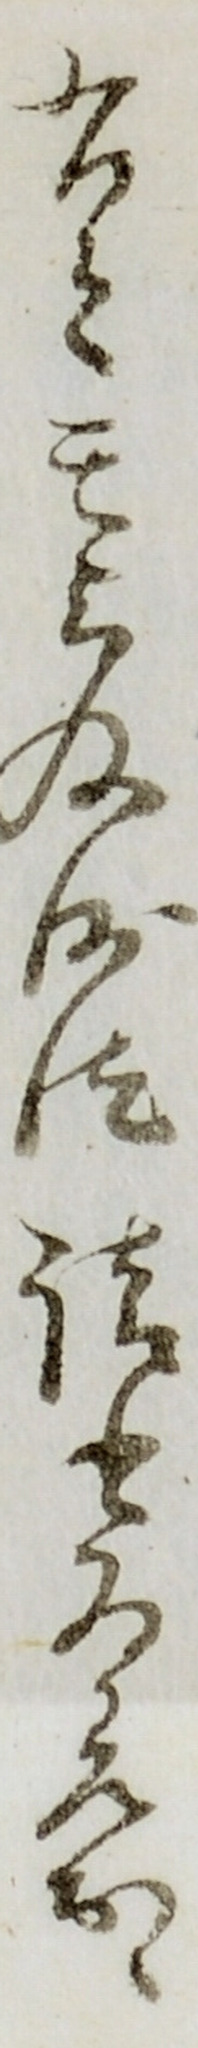有之其被及沙汰請書為差出候
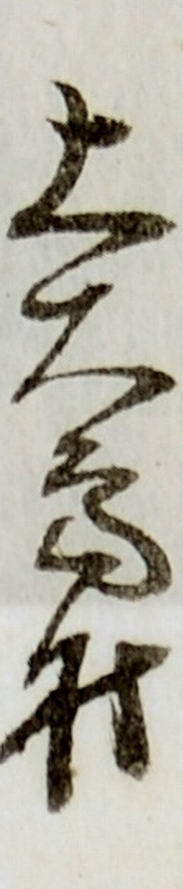上大島村
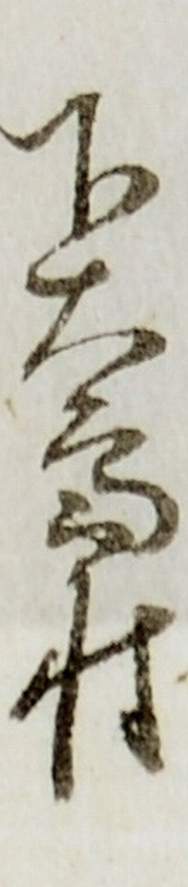下大島村
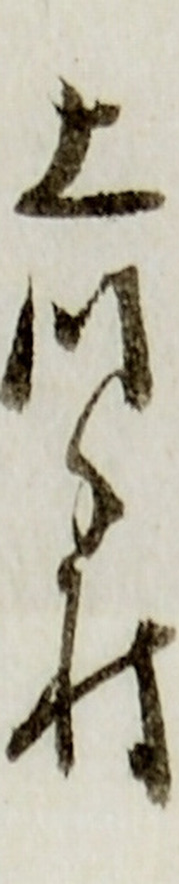上川手村
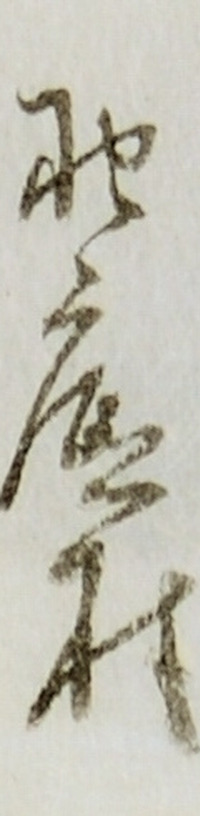野底村
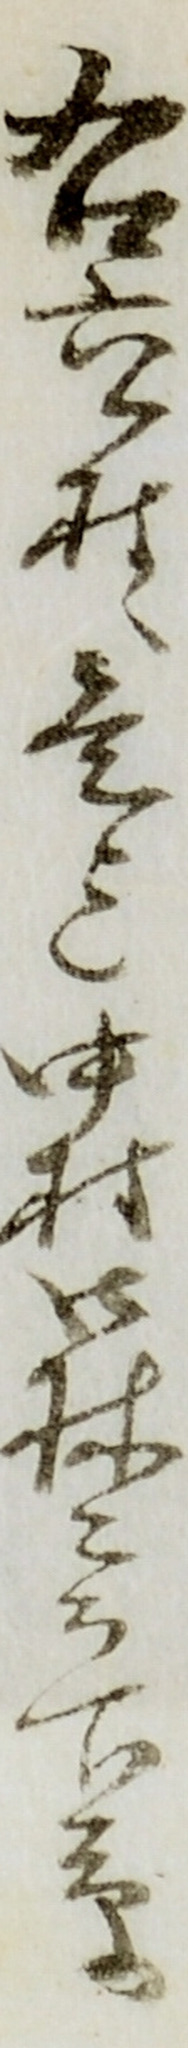右六ヶ村へ是迄中村御林にて下草
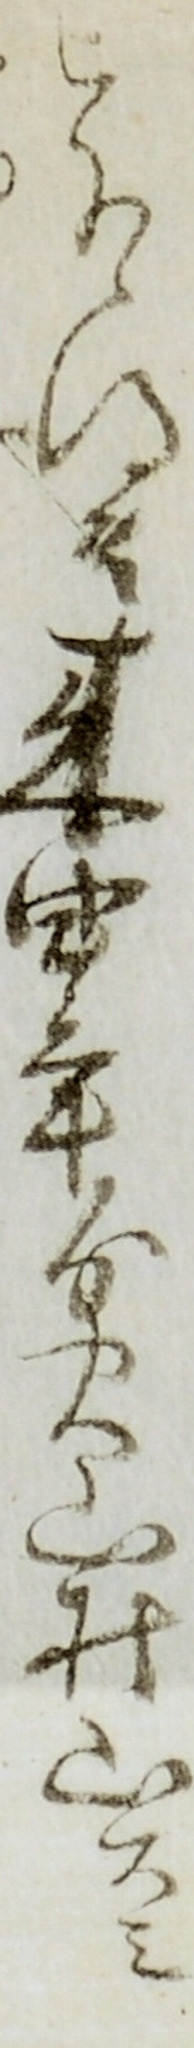被下候得共来申年ゟ火山村山スミ
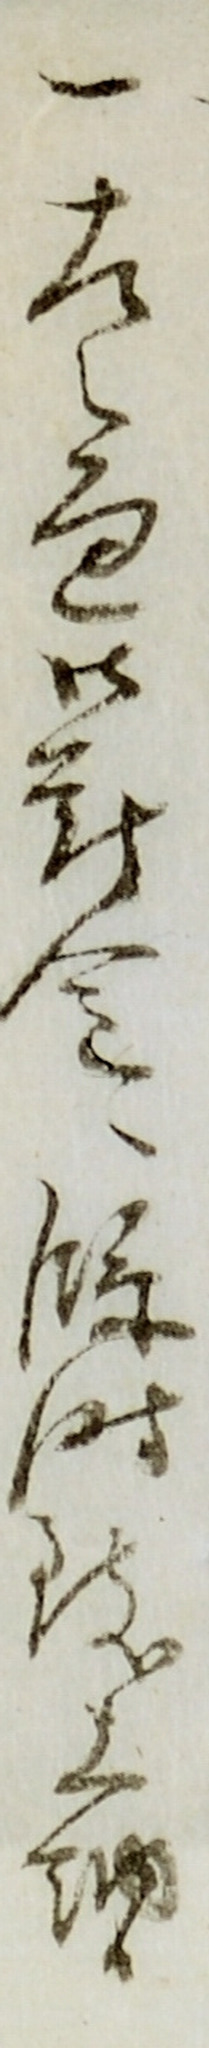一左之通御封金へ臨時致上納候
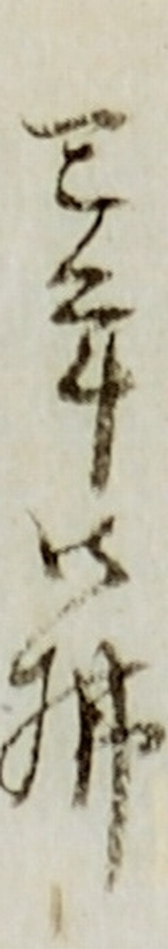巳年御払
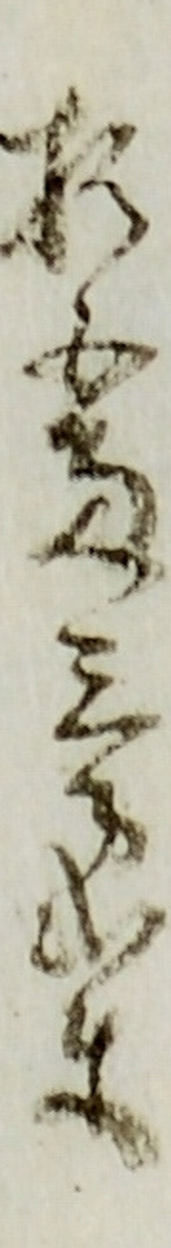拾五両三分弐朱札
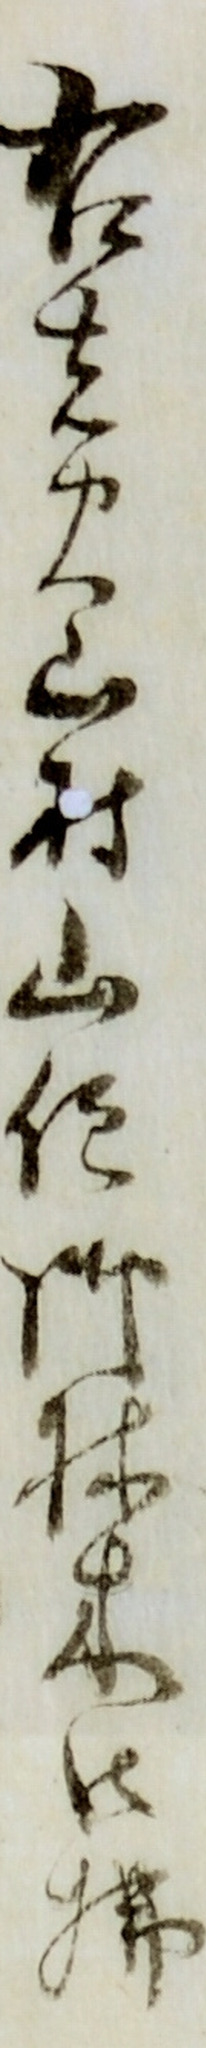右は火山村山住御林木御払
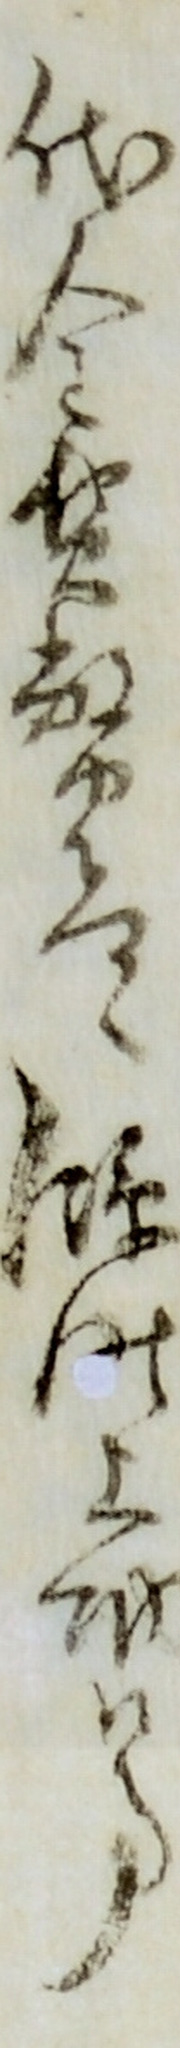代金貨幣局へ臨時上納候事

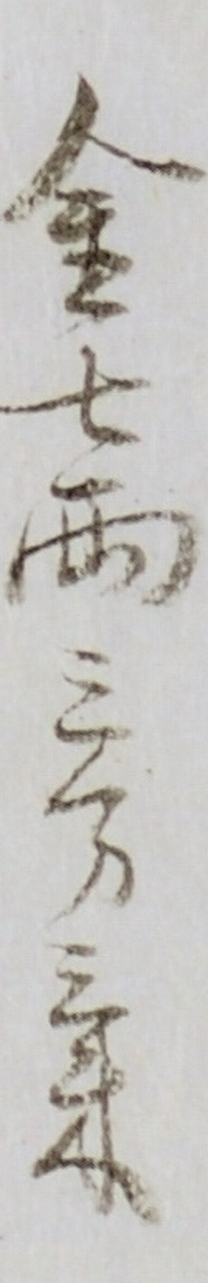金七両三分三朱
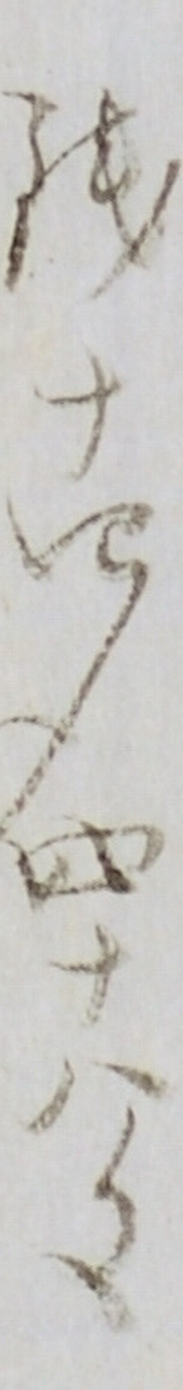銭十四貫四十八文
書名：山林方諸事御用留
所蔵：伊那市立高遠町図書館・合同会社AMANE
